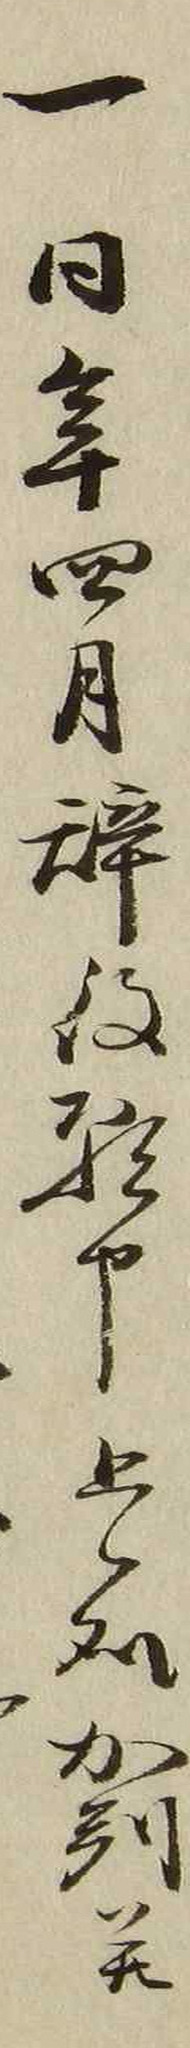一同年四月辞役願申上候処加列并
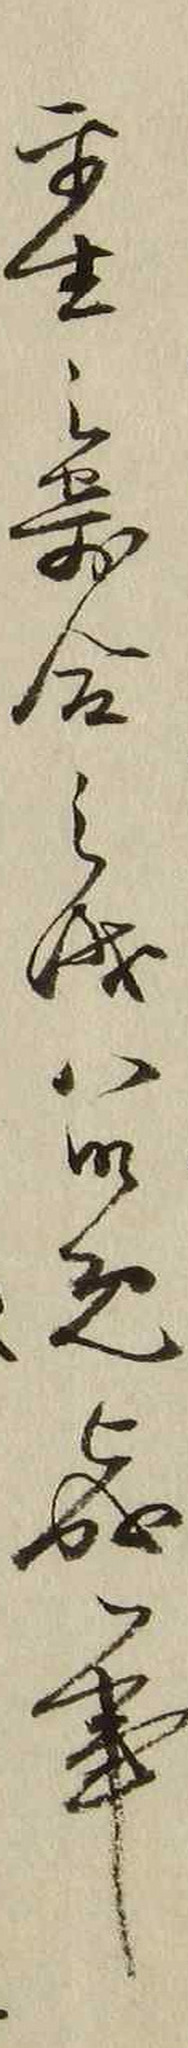平生之寄合之儀は御免被成候事
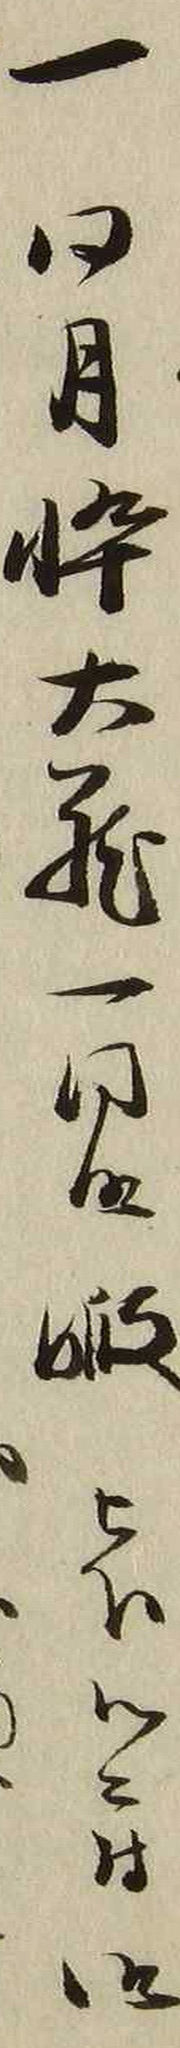一同月忰大蔵一同御暇被下候に付御
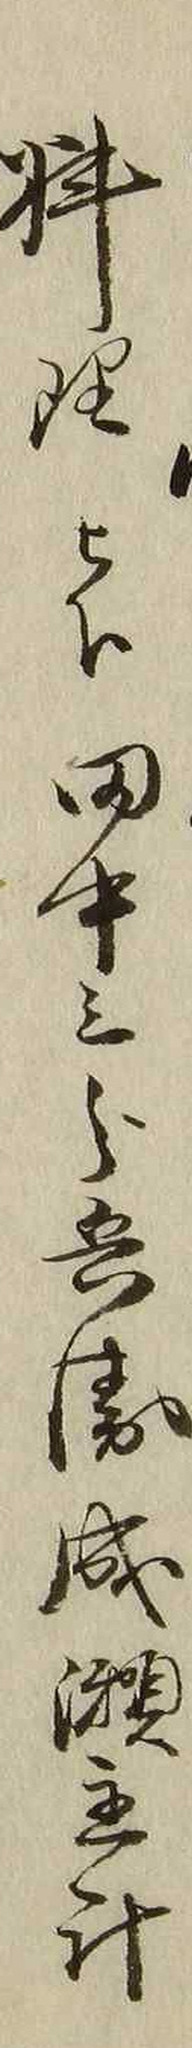料理被下田中三郎兵衛成瀬主計
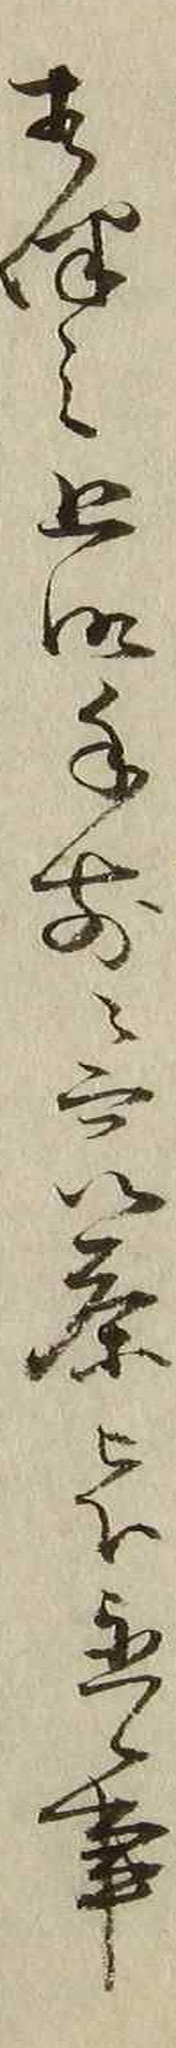相伴之上御手前に而御茶被下置候事
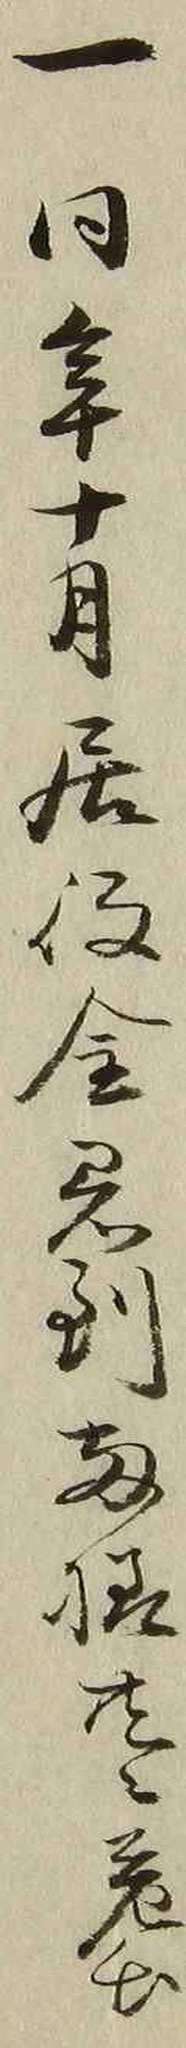一同年十月居役金名別両様共に差出
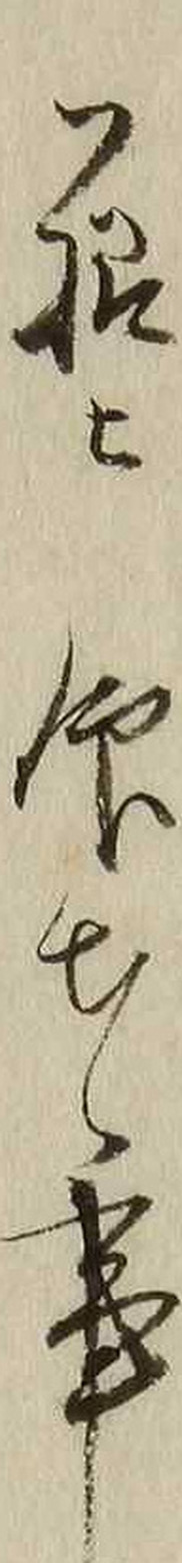候様被仰出候事
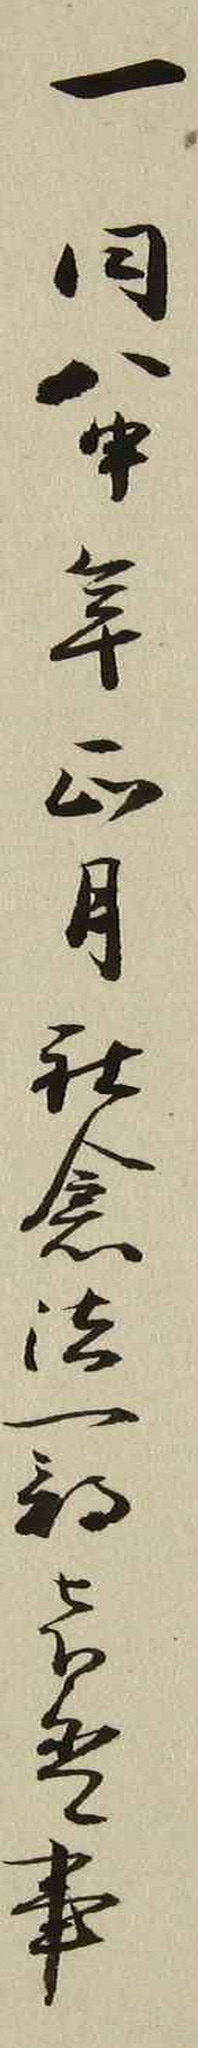一同八申年正月社念法一部被下置候事
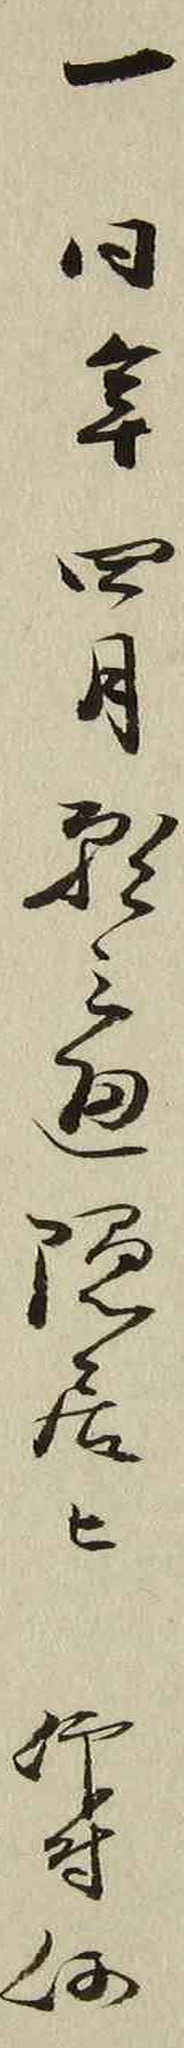一同年四月願之通隠居被仰付何
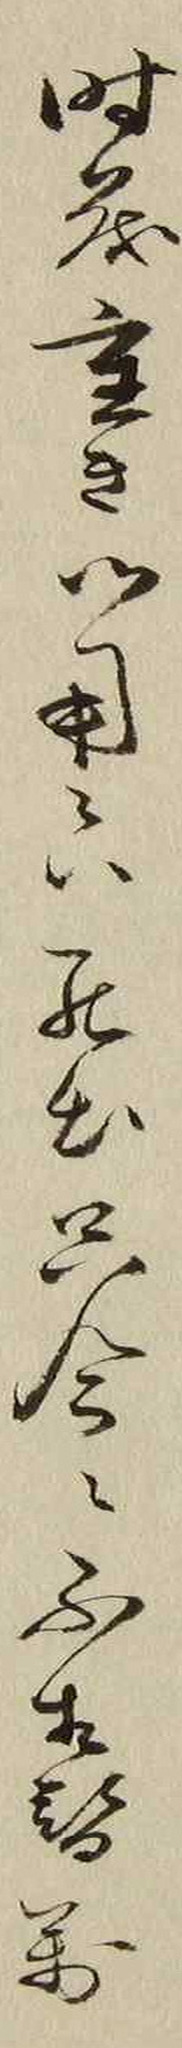時も重き御用には罷出只今に不相替万
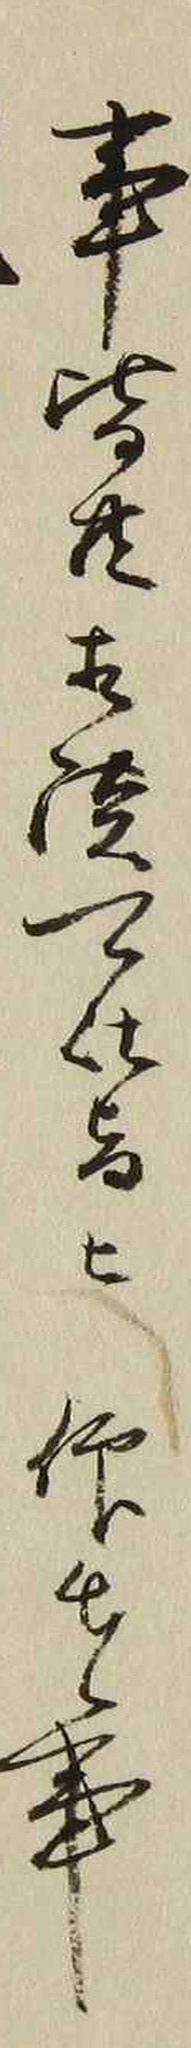事皆共相談可仕旨被仰出候事
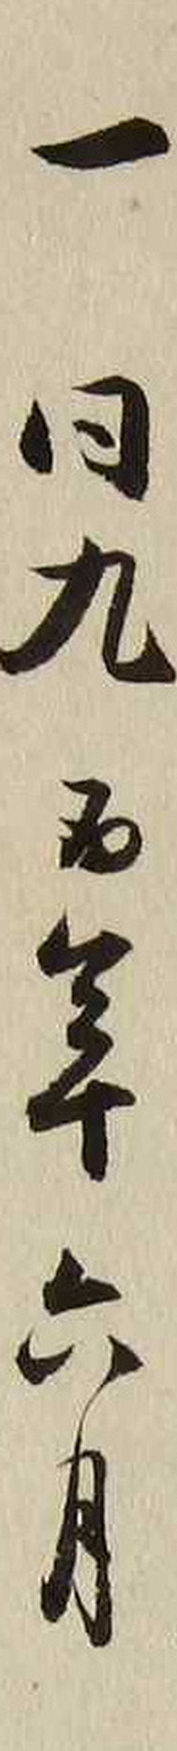一同九酉年六月
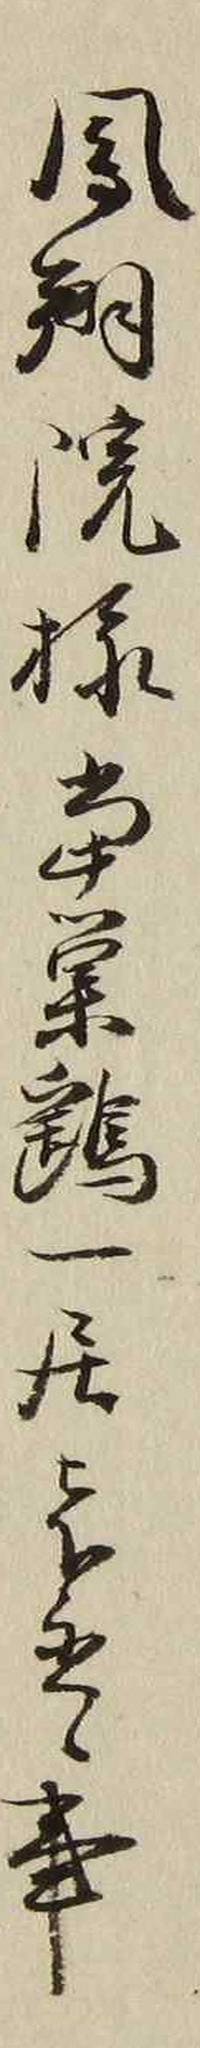鳳朔院様当巣鶉一居被下置候事
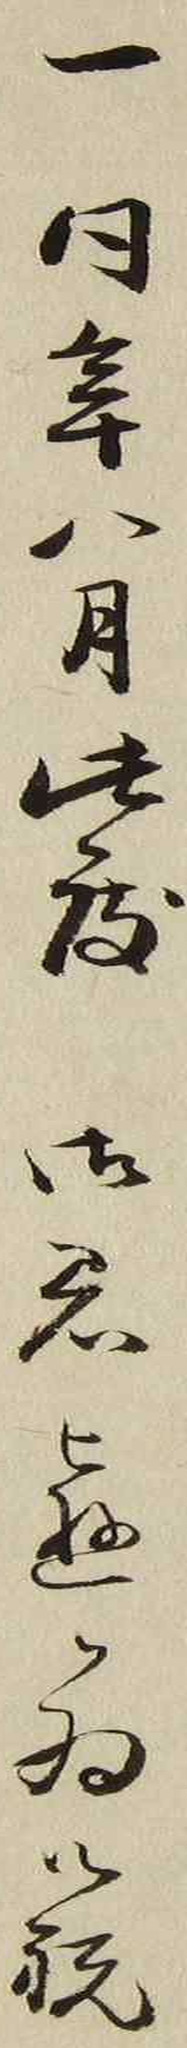一同年八月此度御着被遊候為御祝
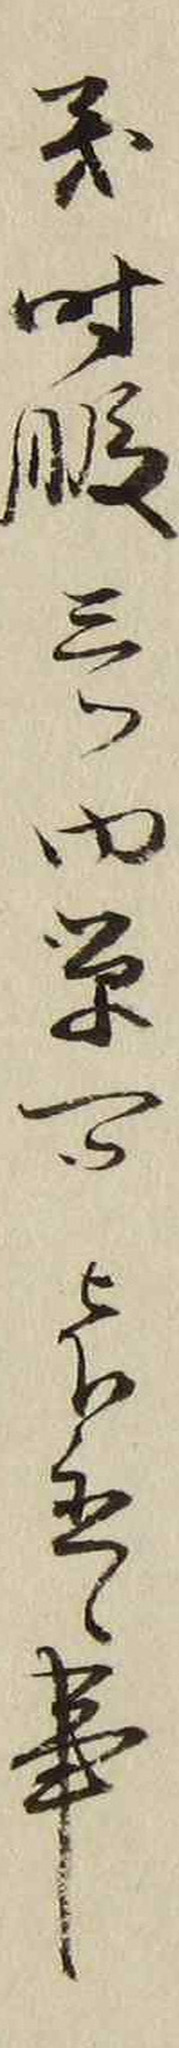義時服三つ内単一つ被下置候事
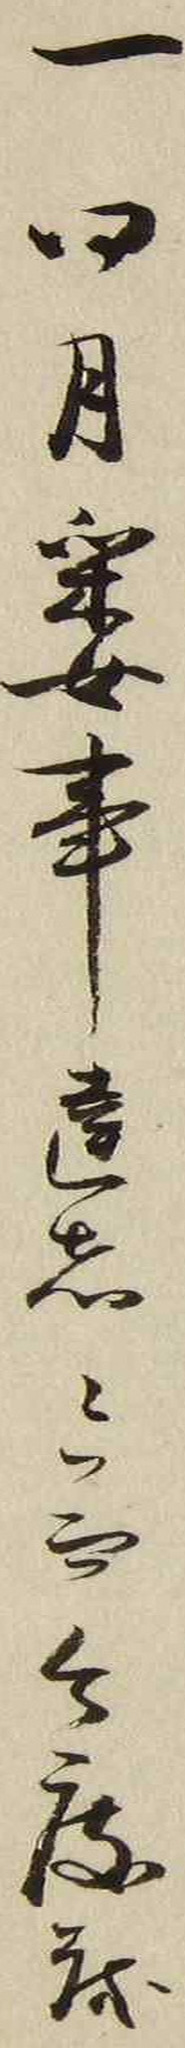一同四月采女事達者に候而今度も
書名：諸士系譜　巻之292　き之部1
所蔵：会津若松市立会津図書館
